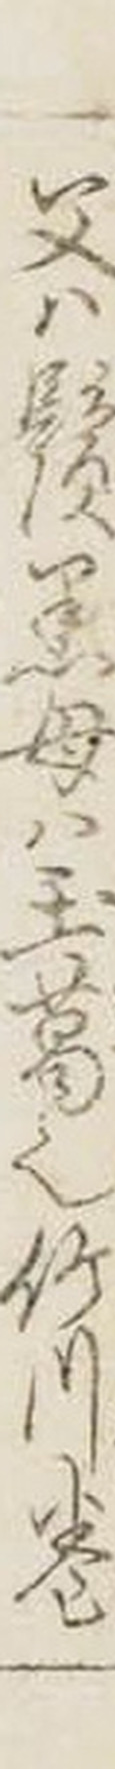父は鬚黒母は玉葛也竹川巻
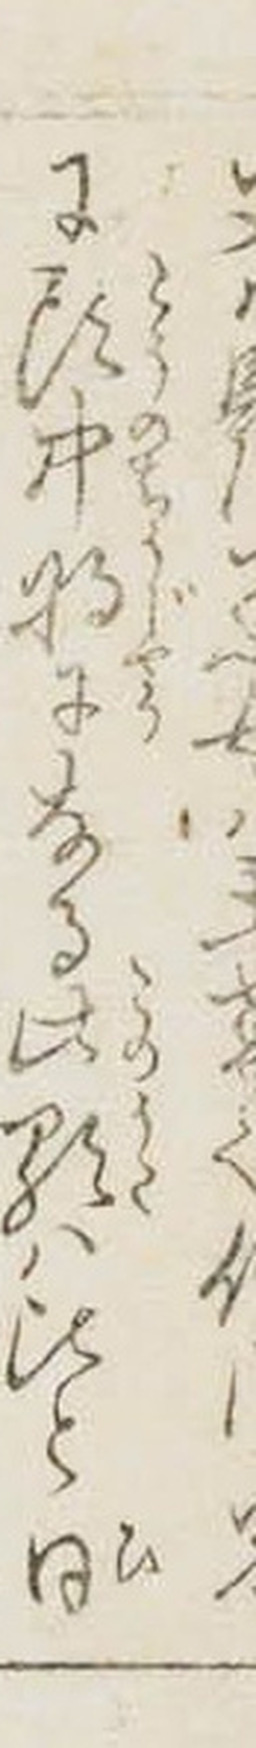に頭中将になる此歌はひと日
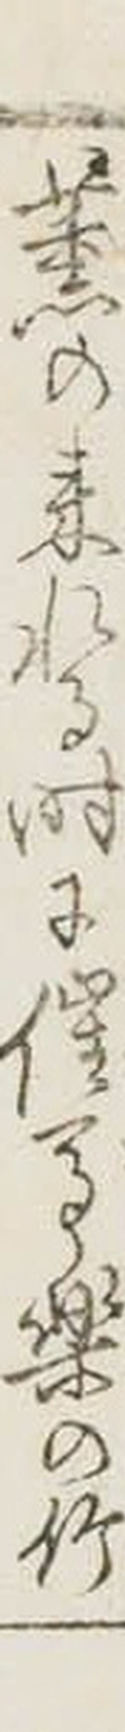薫の来れる時に催馬楽の竹
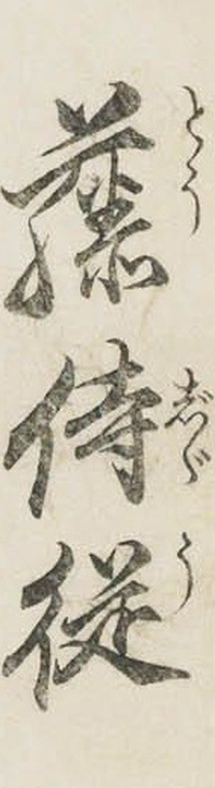藤侍従
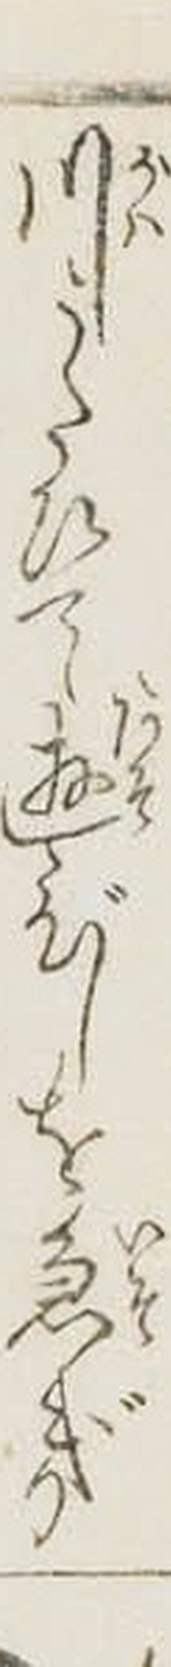川うたひて遊びしを急ぎ
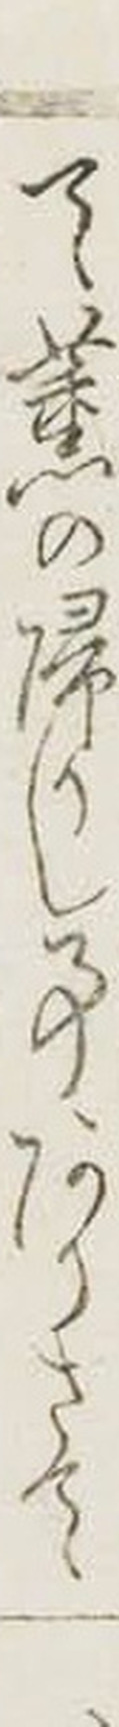て薫の帰りし事ありさて
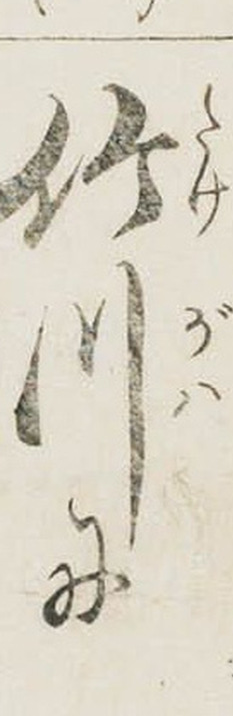竹川に
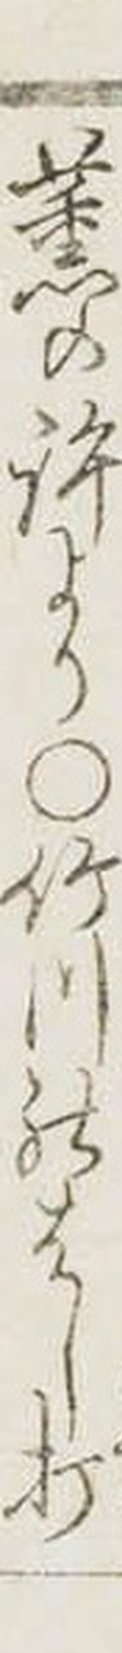薫の許より○竹川のはし打
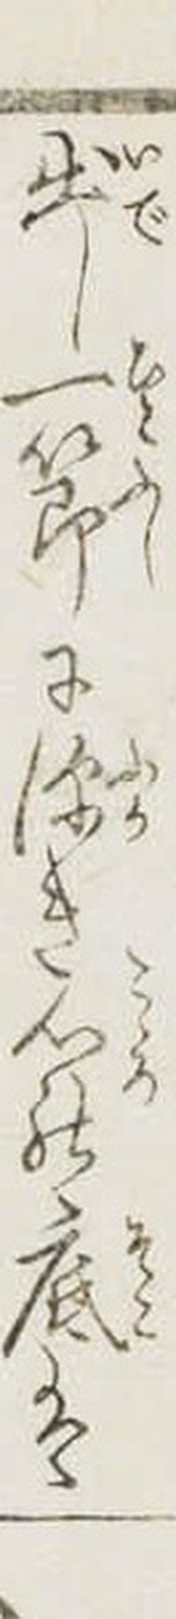出し一節に深き心の底は
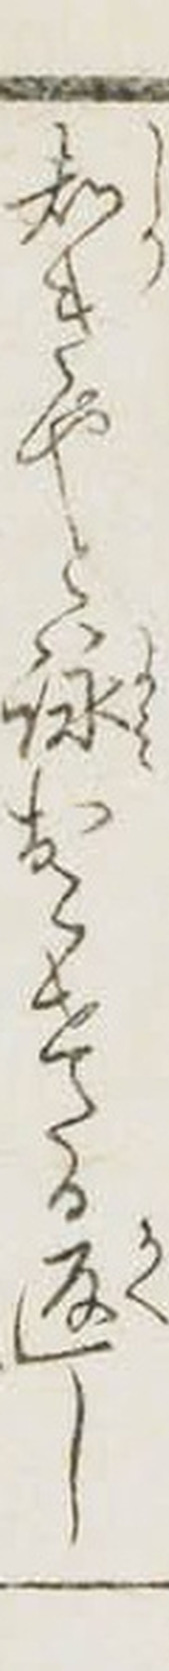知きやと詠おこせたる返し
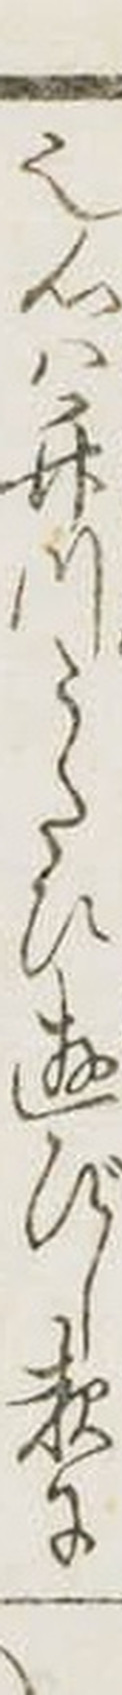也心は竹川うたひ遊びし夜に
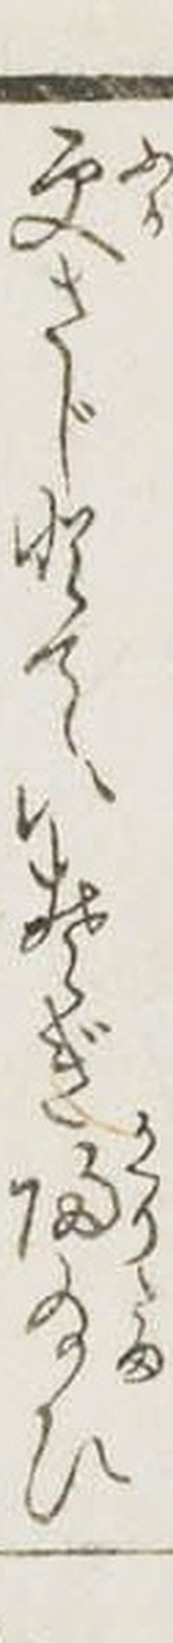更さじとていそぎ帰給ひ
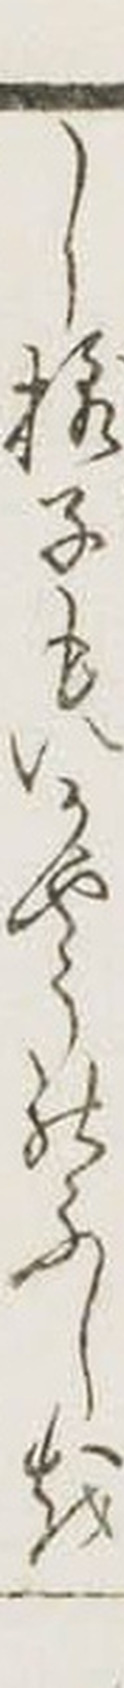し様子もいかやうのふしを
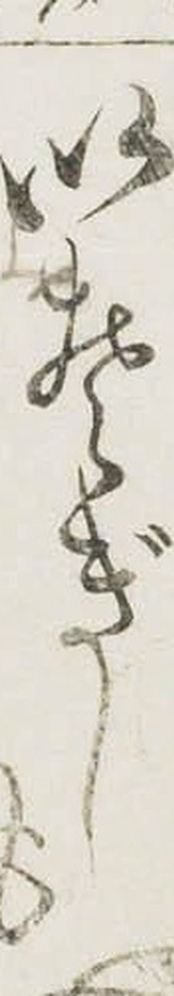いそぎしも
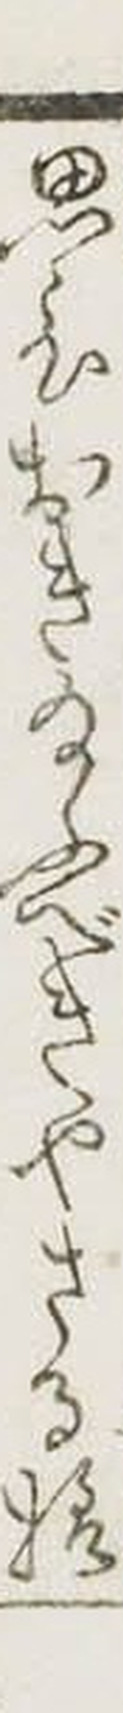思ひおき給ふべきやさる様
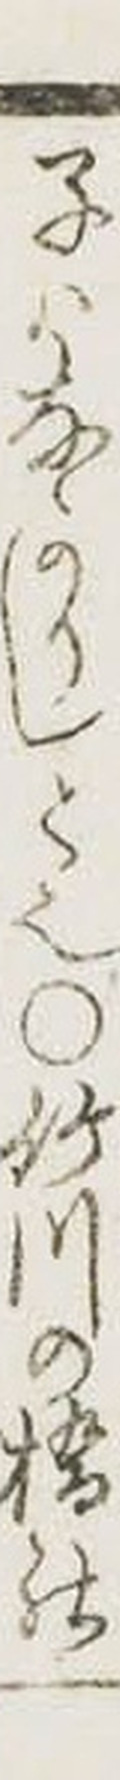子はなかりしと也○竹川の橋の
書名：源氏百人一首
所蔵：東京学芸大学教育コンテンツアーカイブ
